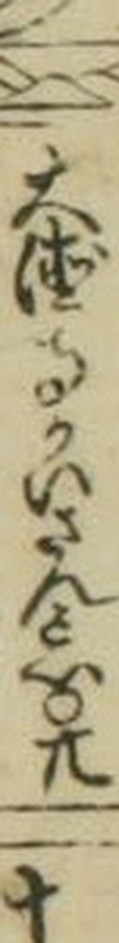大徳寺かおさん忌○廿
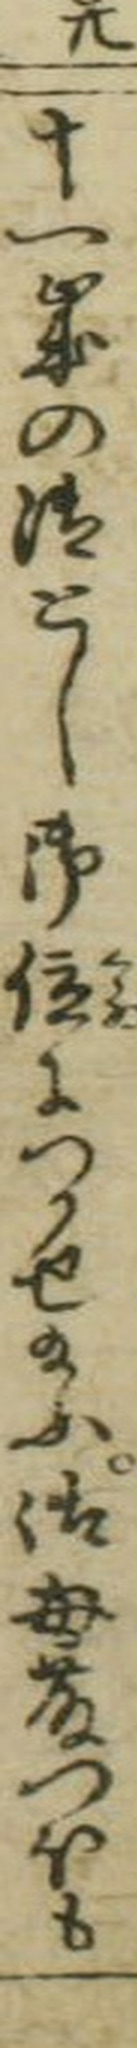十一歳の御とし御位につかせ給ふ。御母藤つほも
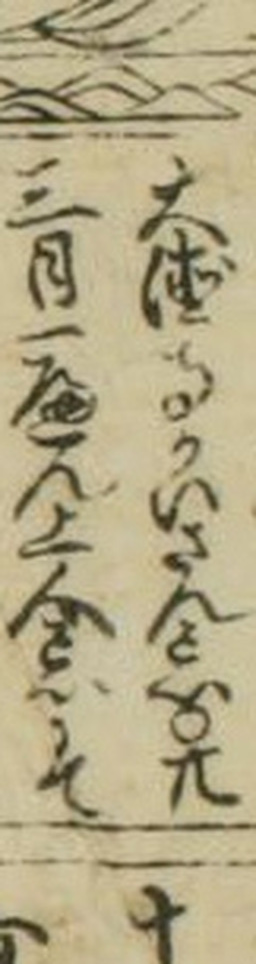三日一へん上人忌にて
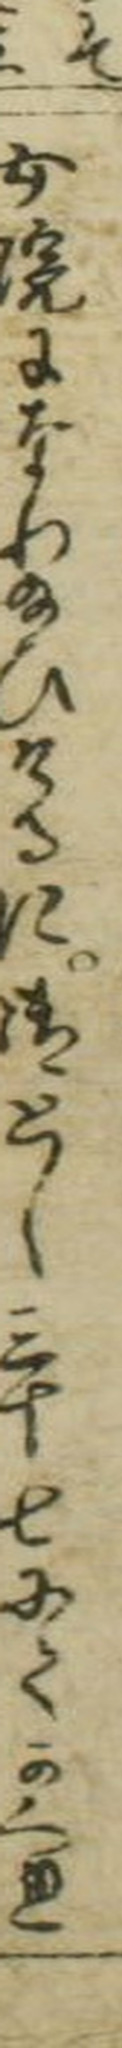女院になり給ひけるに。御とし三十七にてかくれ
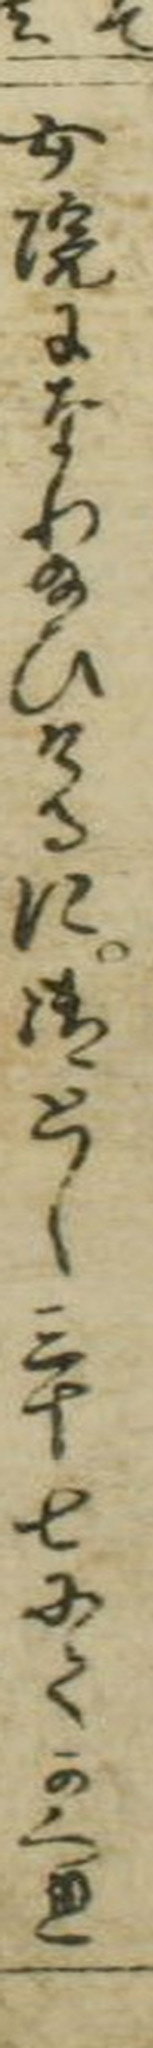女院になり給ひけるに。御とし三十七にてかくれ
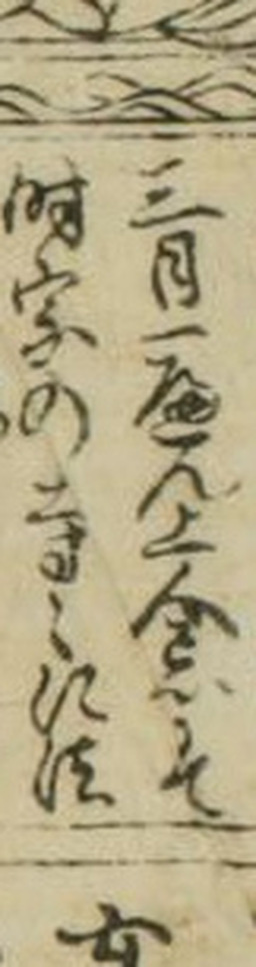時宗の寺々に法
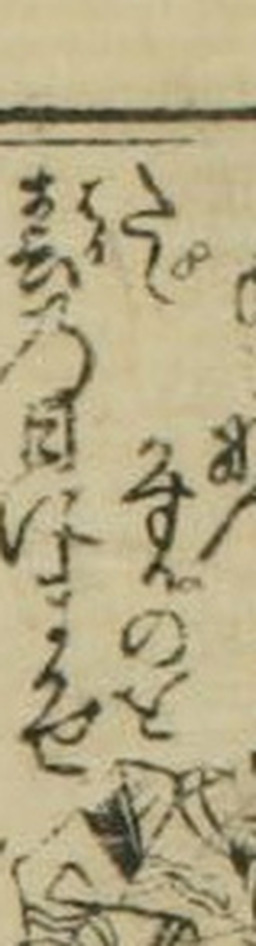春の日にまかせ
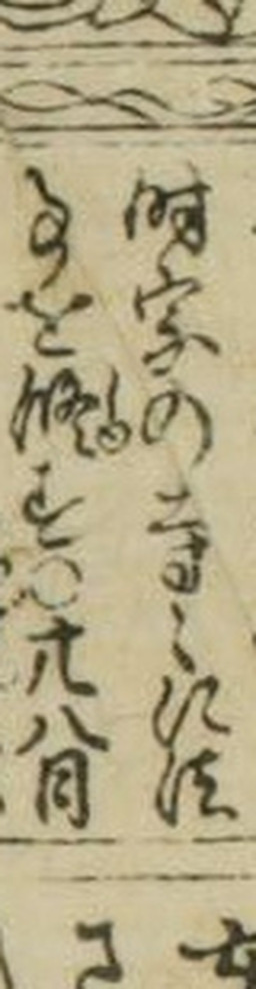事を修す○廿八日
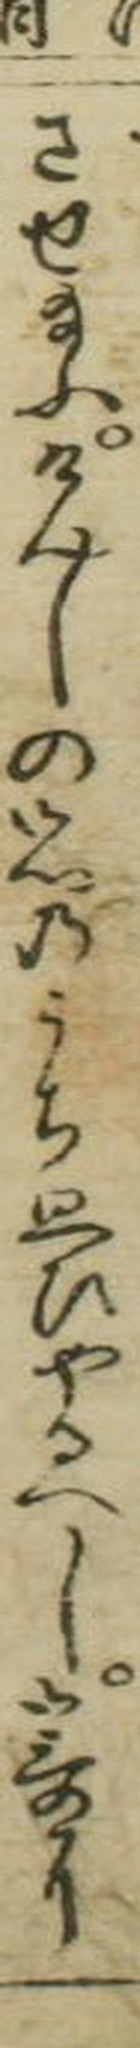させ給ふ。けんしの御心のうち思ひやるへし。御哥に
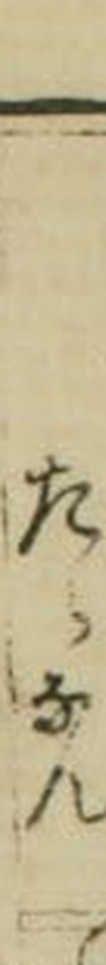たらなん
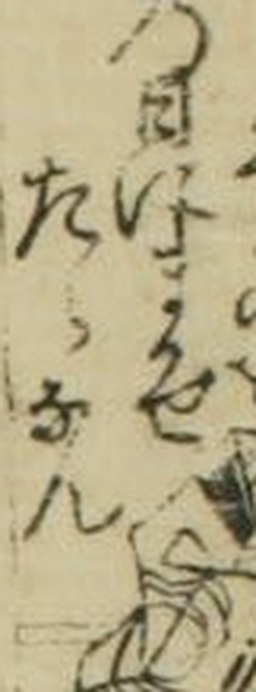たらなん
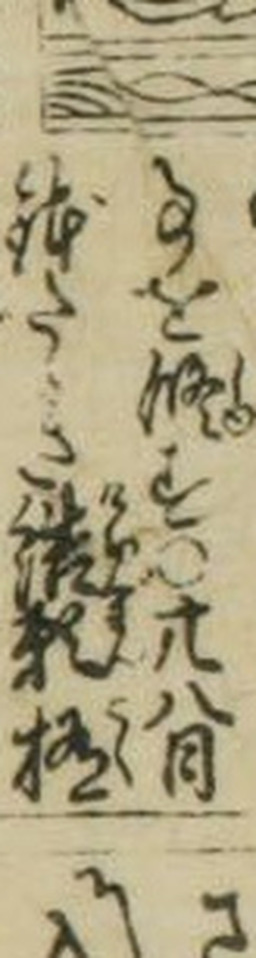鉢たゝき結願極
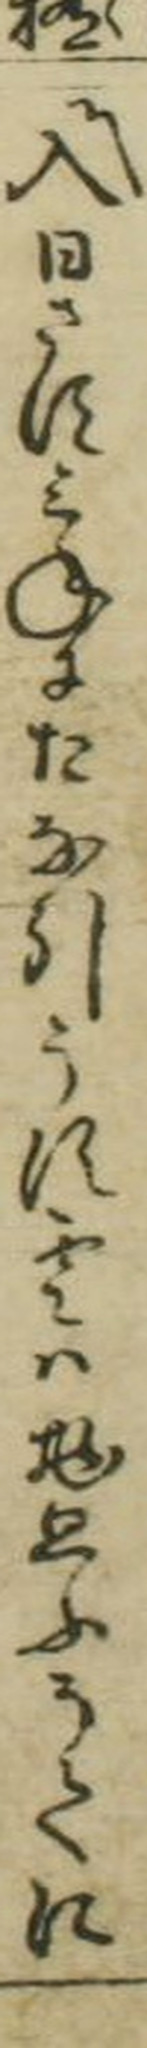〽入日さすみねにたな引うす雲は物思ふそてに
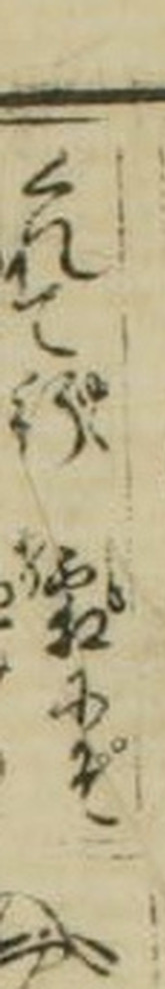くれて行霜にぞ
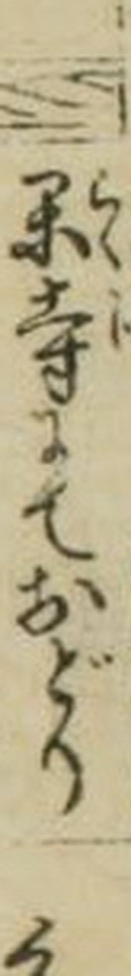楽寺にておどり
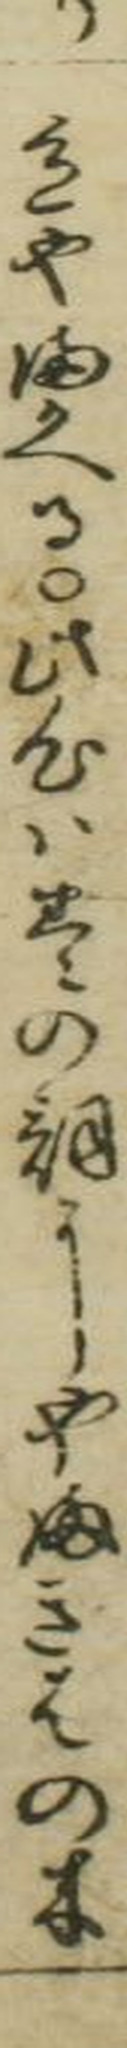色やまかへる○此心は巻の詞にやまきはの木
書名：女源氏教訓鑑
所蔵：東京学芸大学附属図書館
